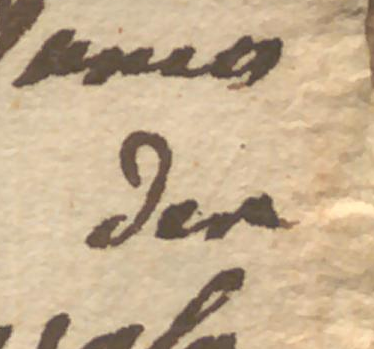der
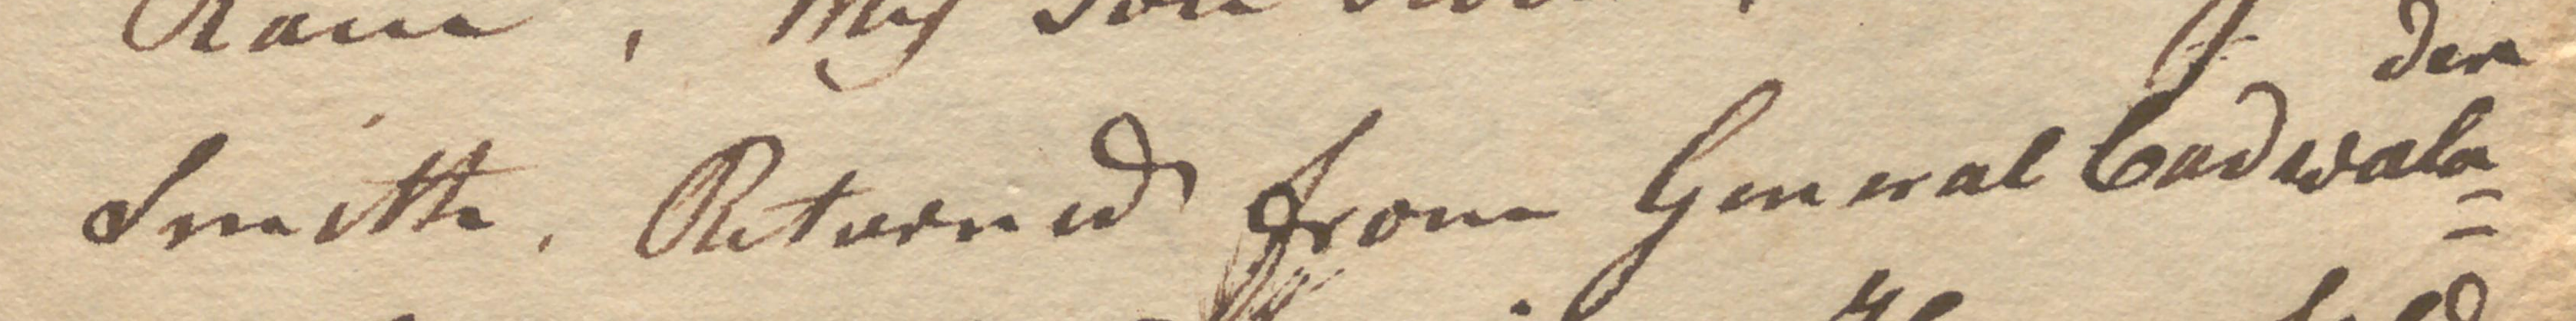Smith, Returned from General Cadwala
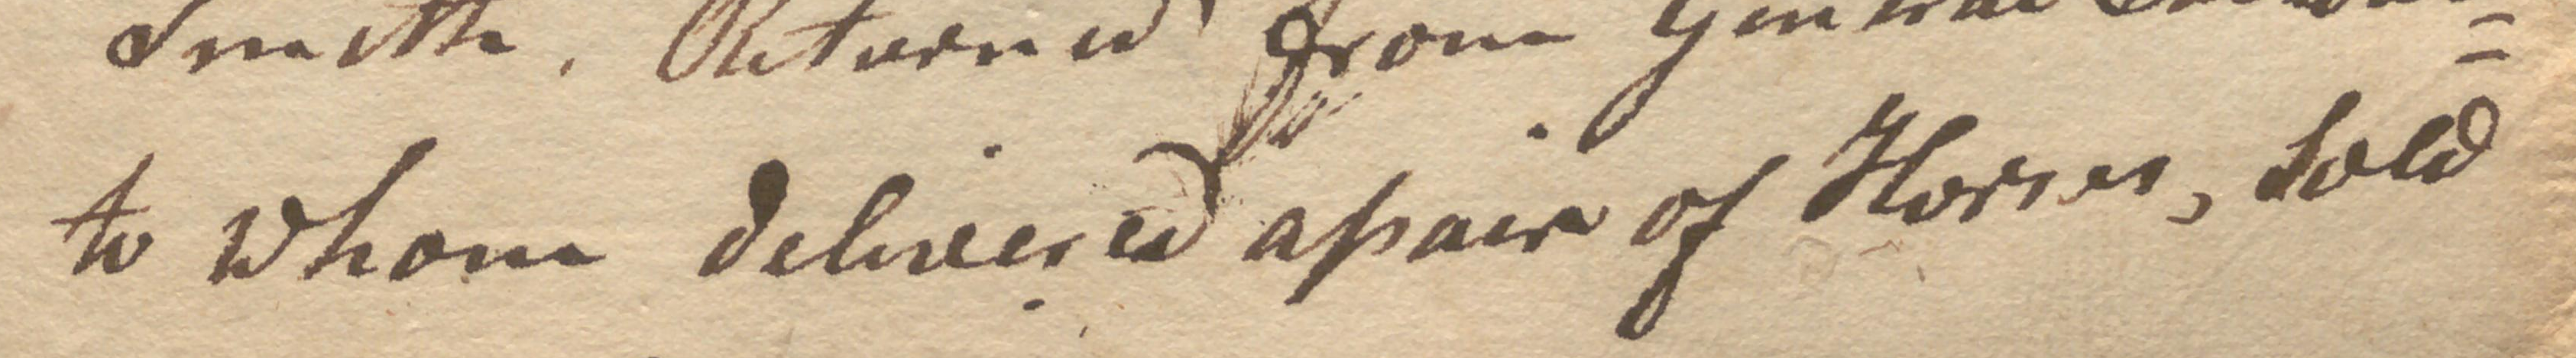to whom delivered a pair of Horses, sold
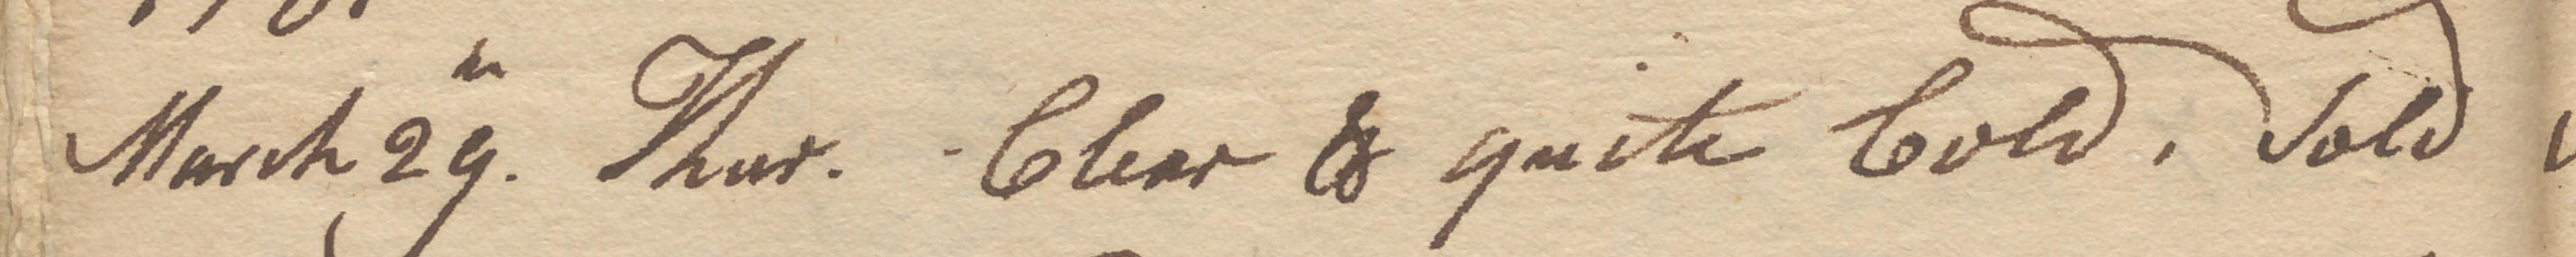March 29^th. Thur. Clear & quite Cold, sold
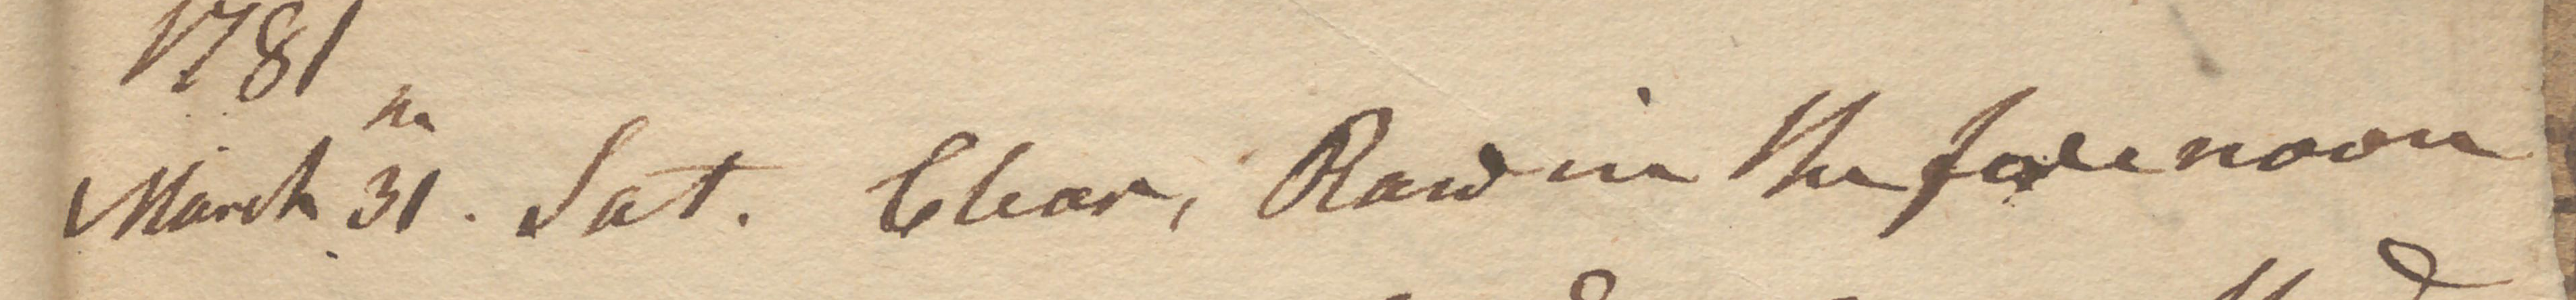March 31^th. Sat. Clear, Raw in the forenoon
